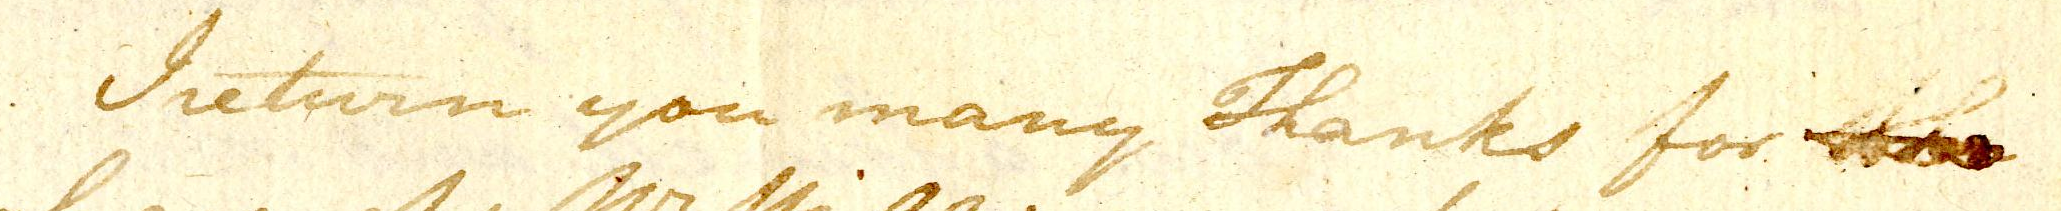I return you many Thanks for [___]
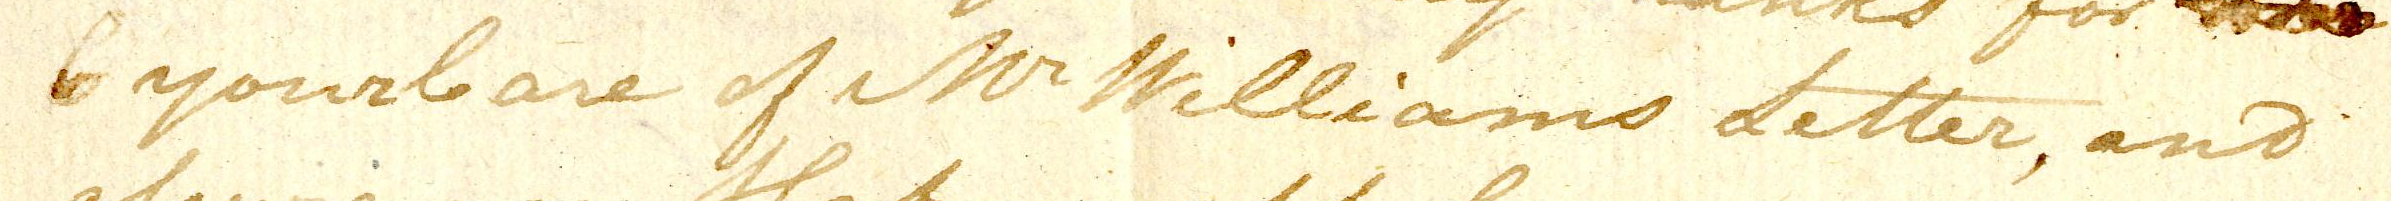your Care of M^r Williams Letter, and
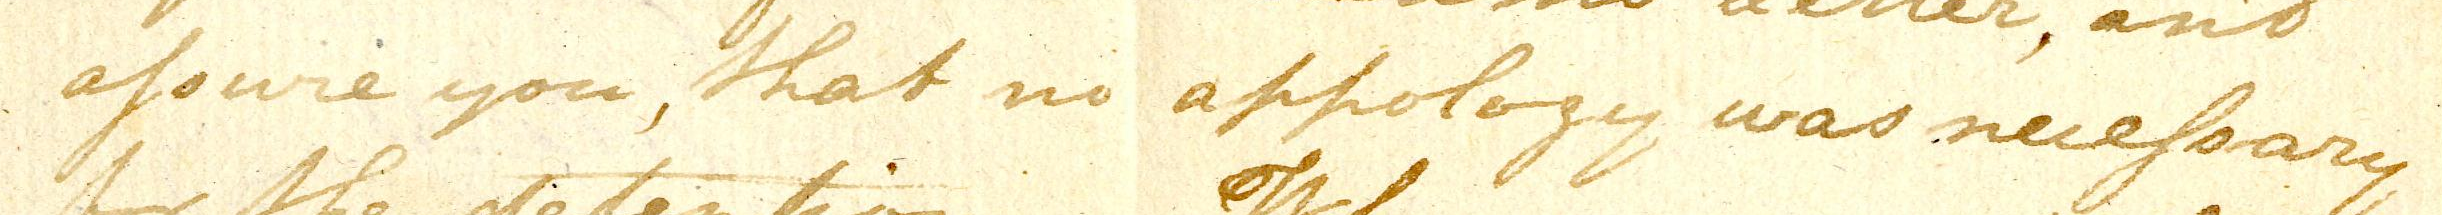assure you, that no appology was necessary
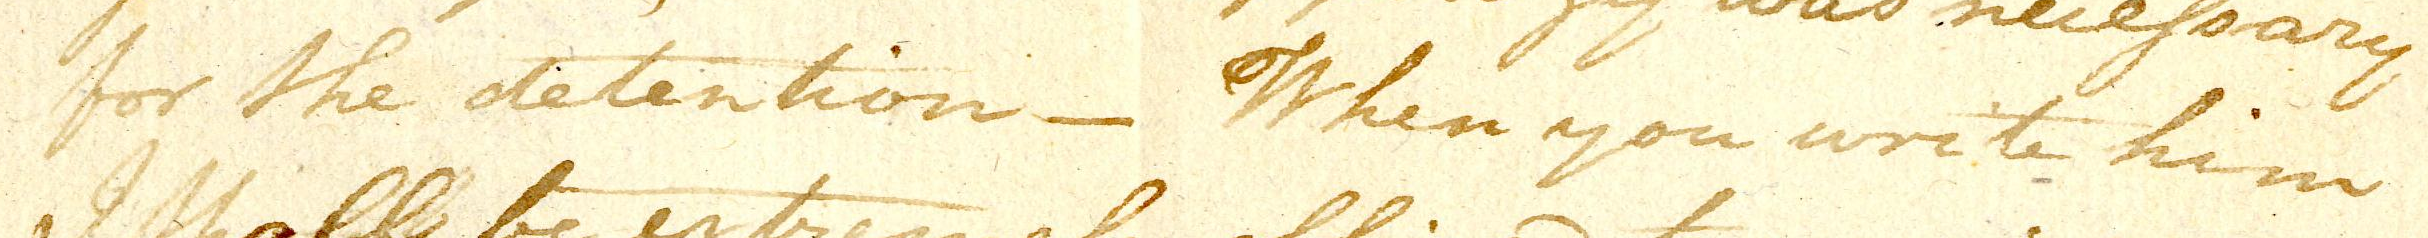for the detention- When you write him
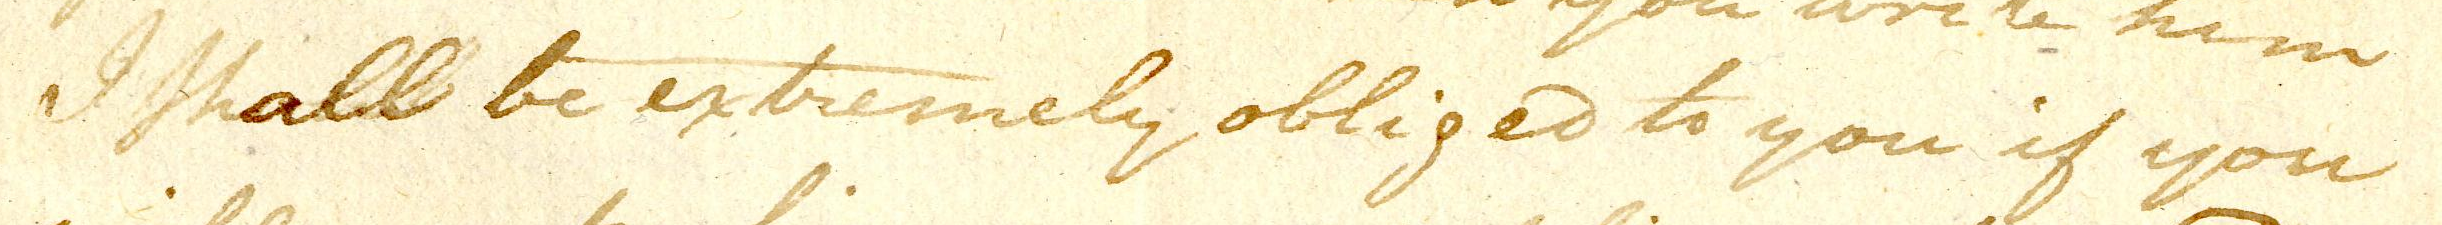I shall be extremely obliged to you if you
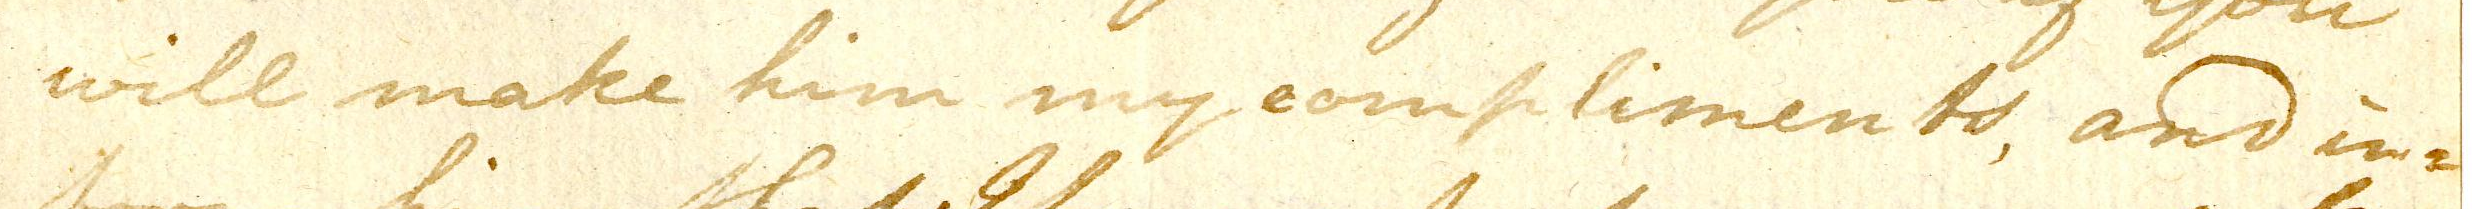will make him my compliments, and in-
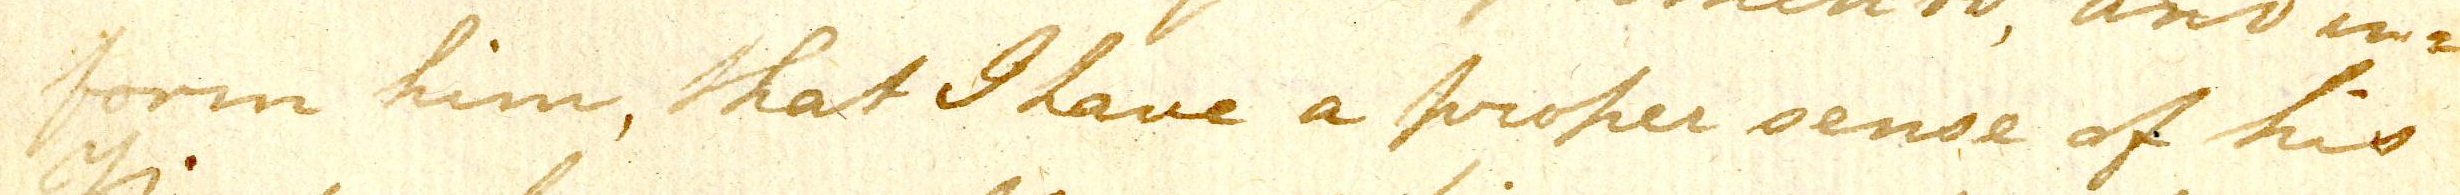form him, that I have a proper sense of his
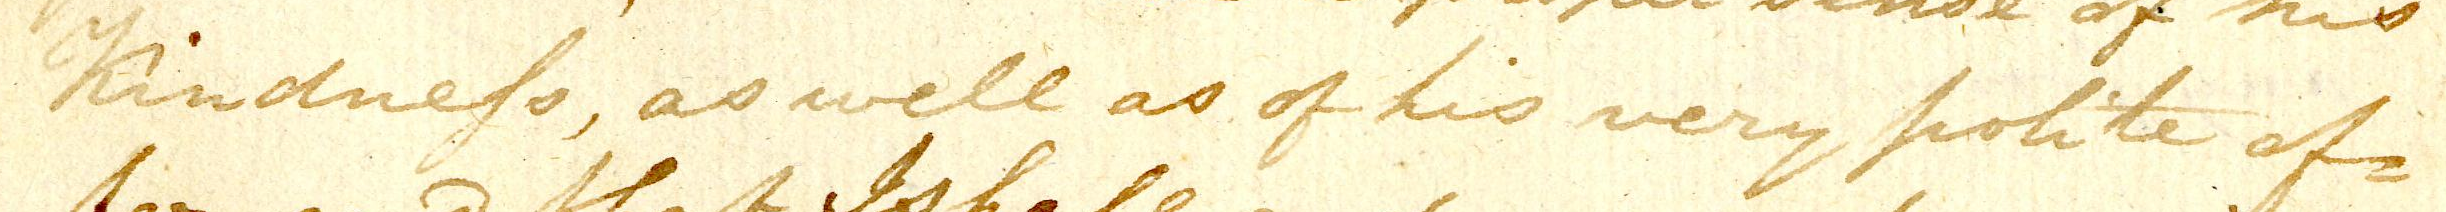Kindness, as well as of his very polite of-
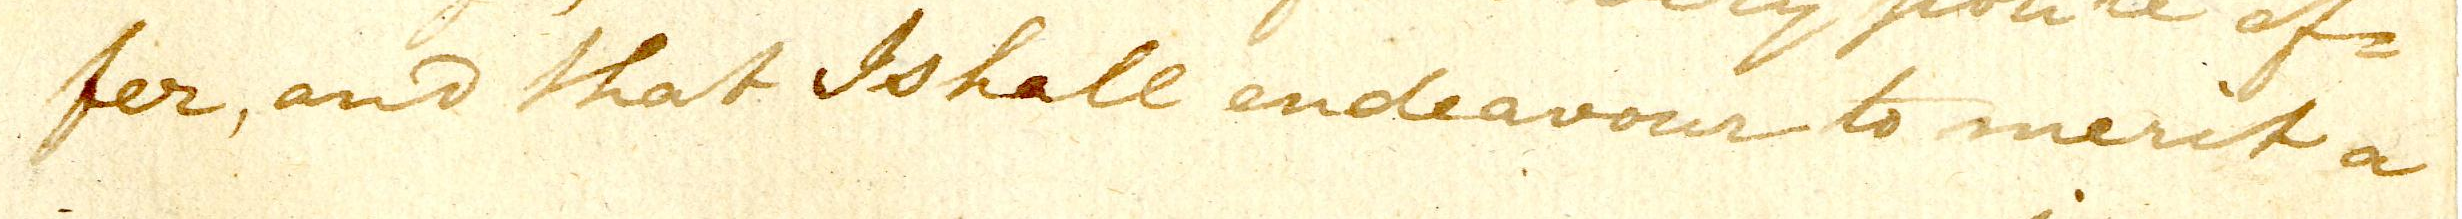fer, and that I shall endeavour to merit a
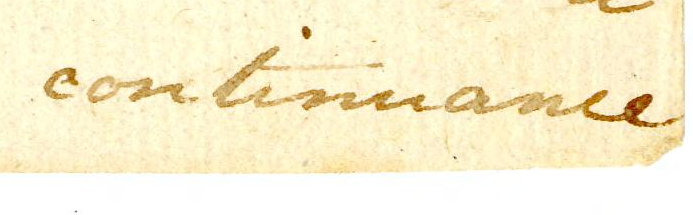continuance
